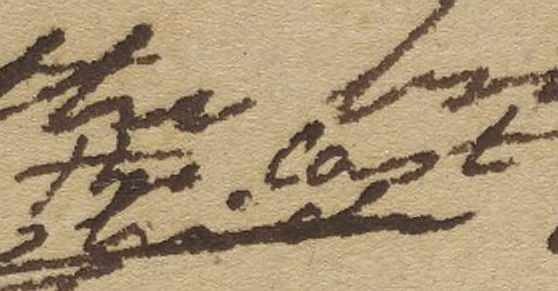the cost
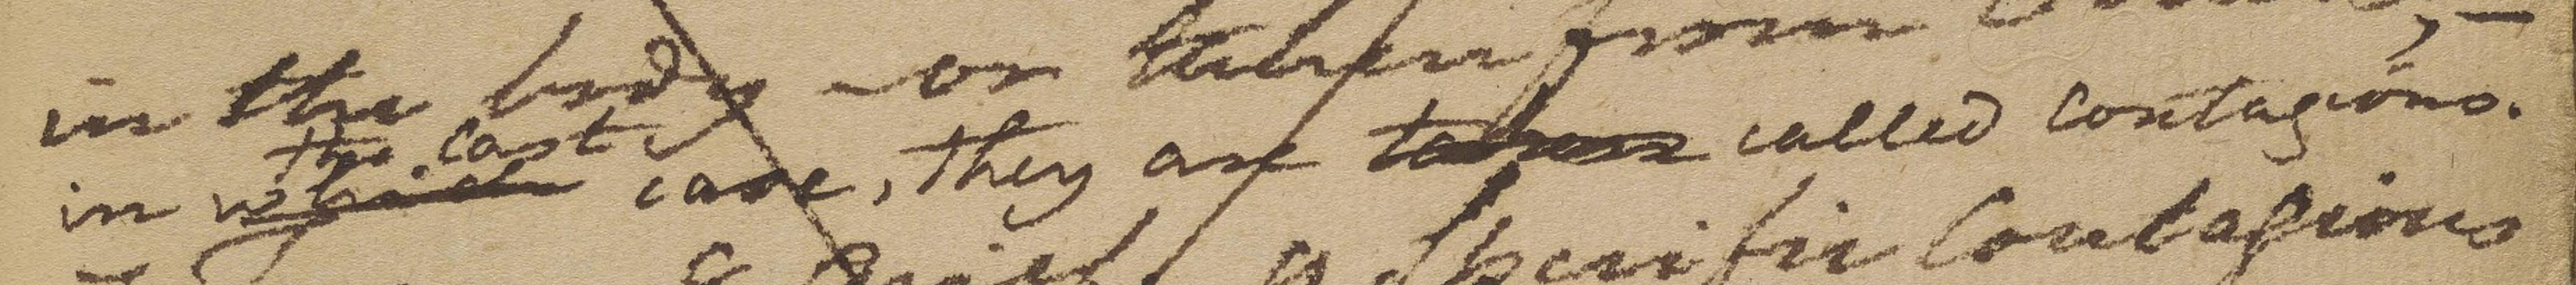in [which] case, they are [taken] called contagions
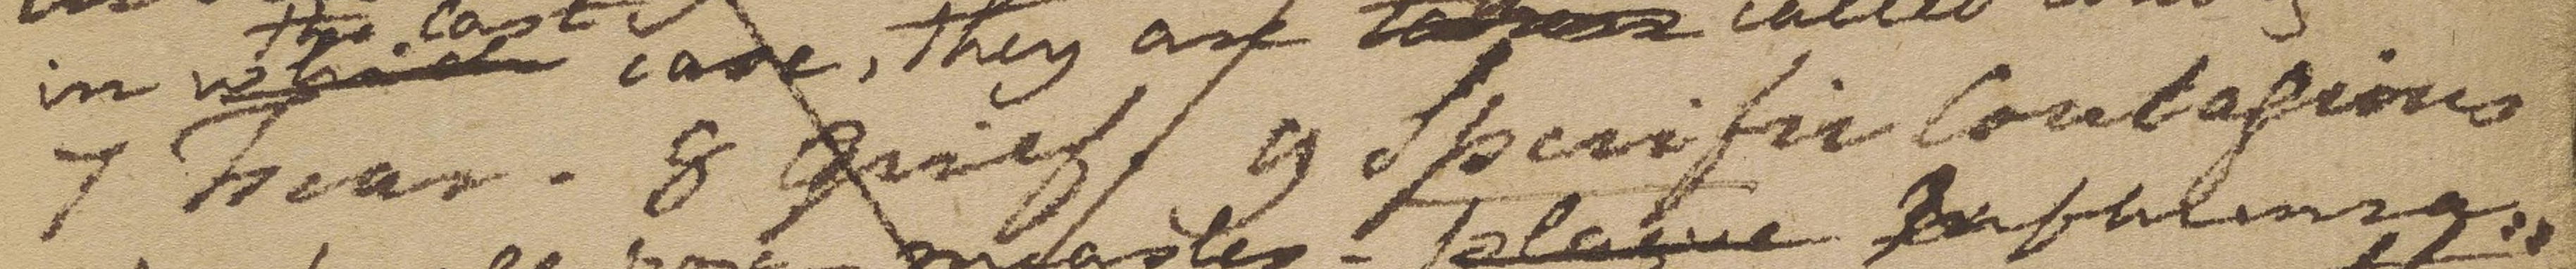7 Fear. 8 Grief. 9 Specific Contagions
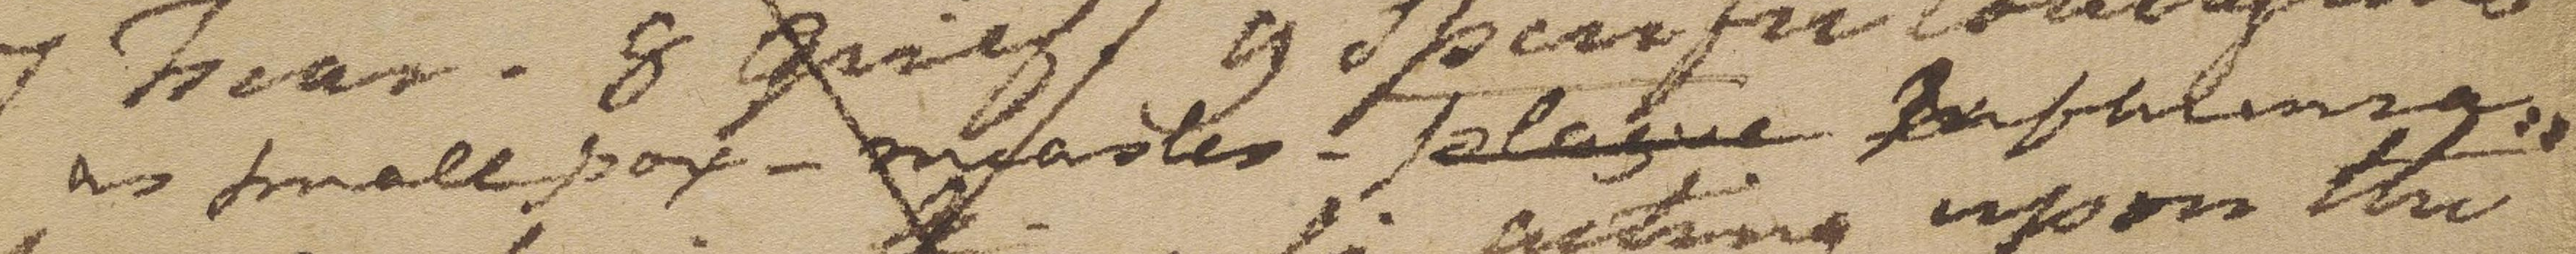as smallpox, measles- [plague] Suffering
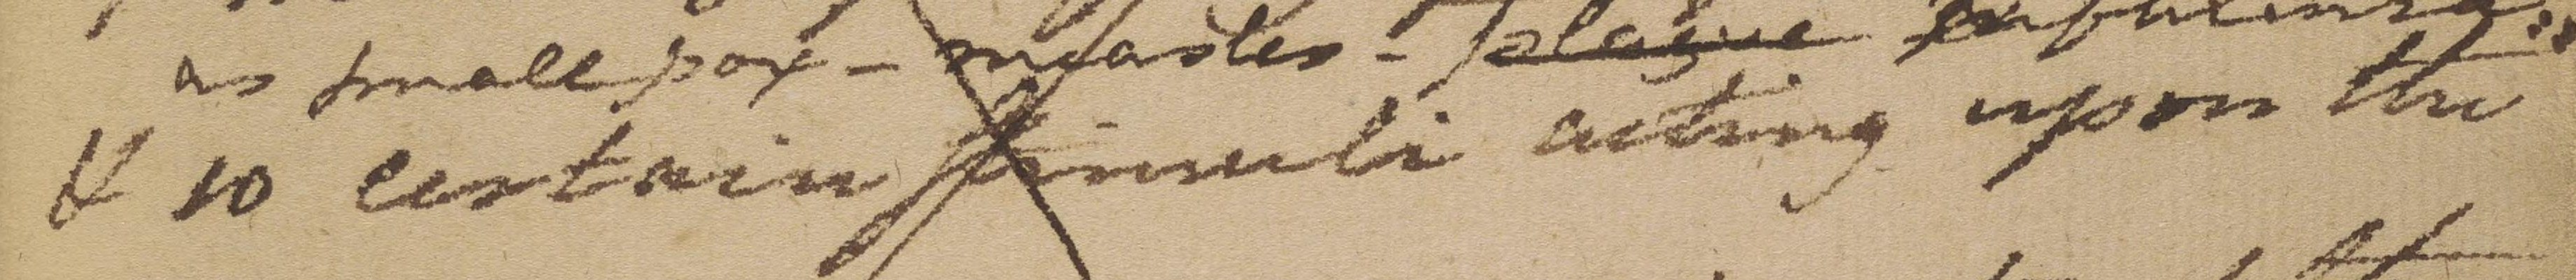& to certain Stimuli acting upon the
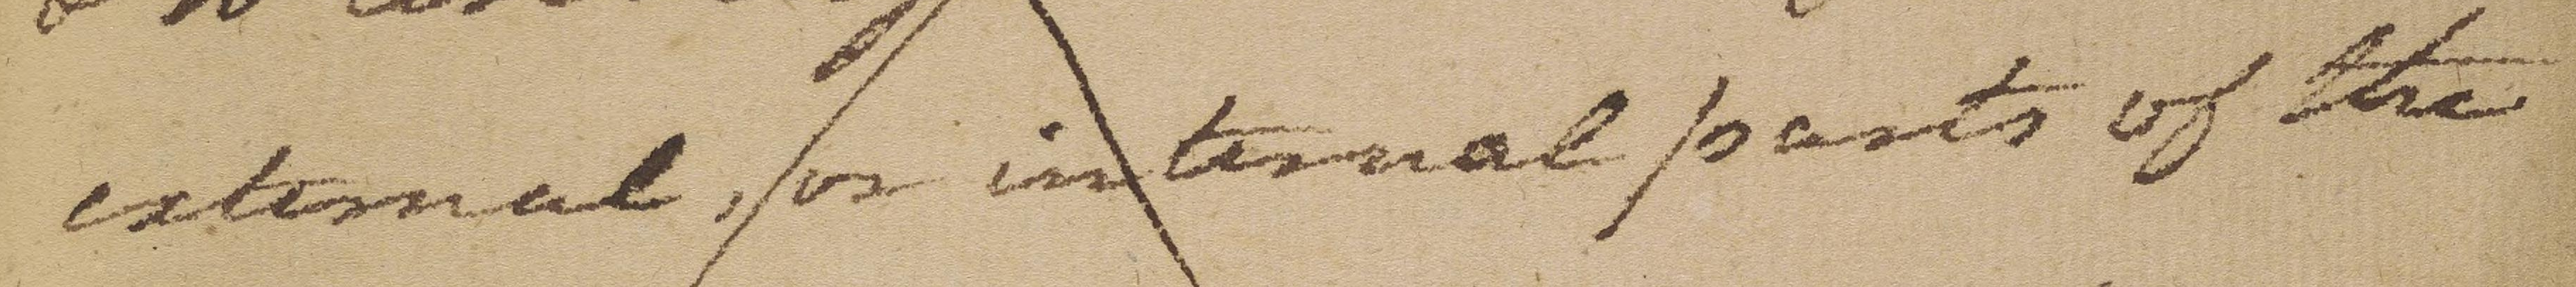external, or internal parts of the
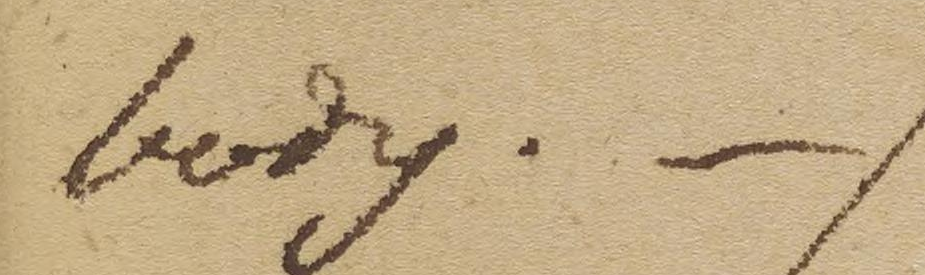body.
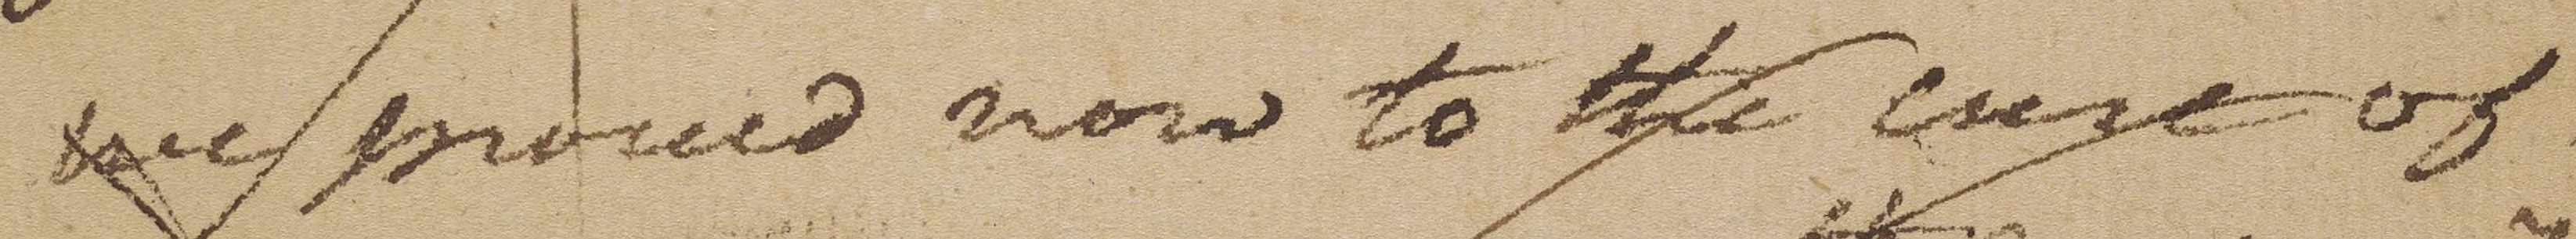We moved now to the case of
